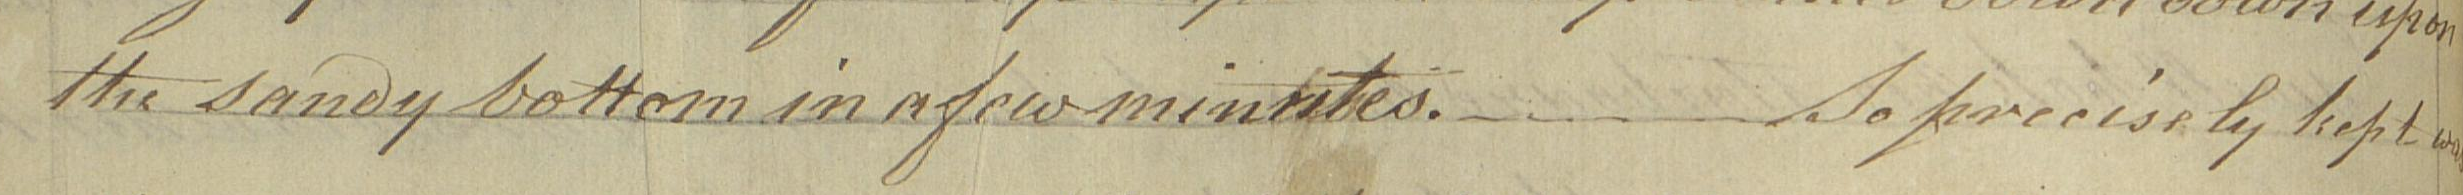the sandy bottom in a few minutes. So precisely kept
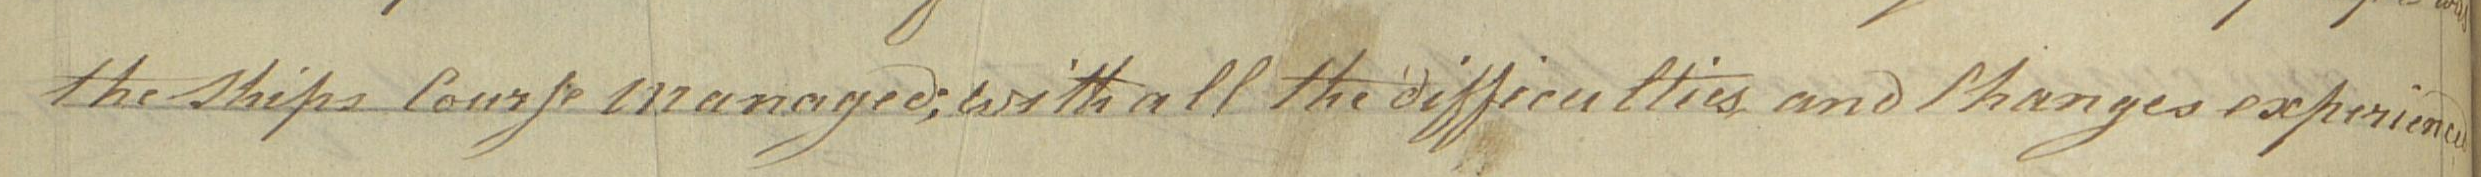the Ships Course managed; with all the difficulties and Changes experienced
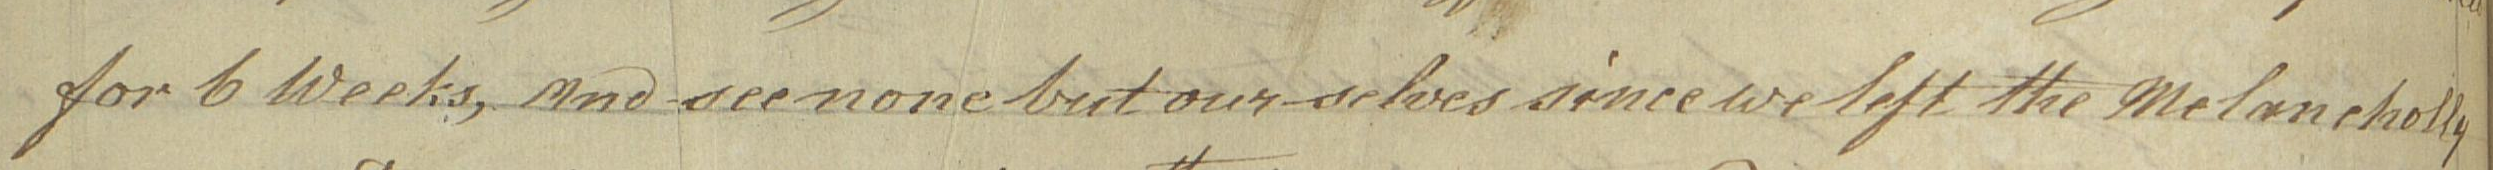for 6 Weeks, and see none but our selves since we left the Melancholly
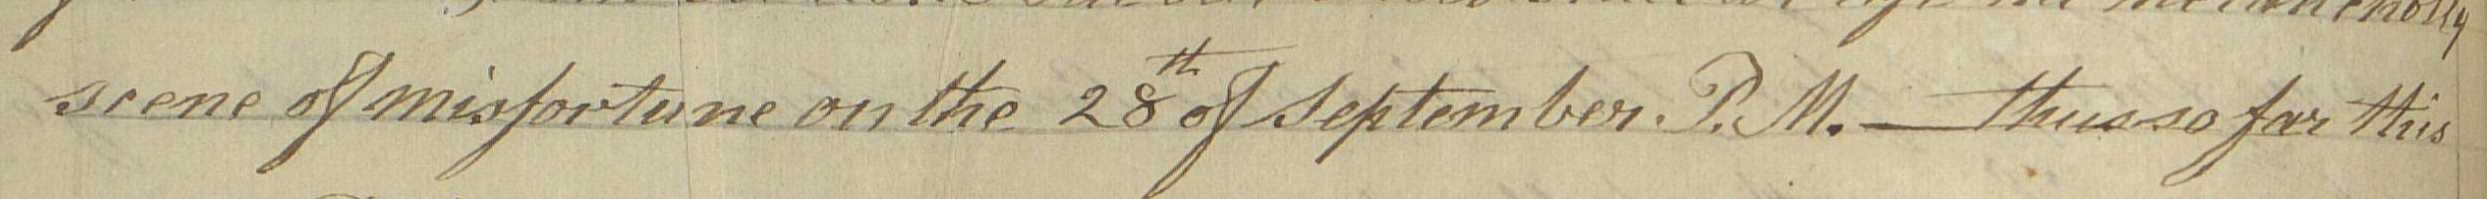scene of misfortune on the 28^th of September P.M. thus so far this
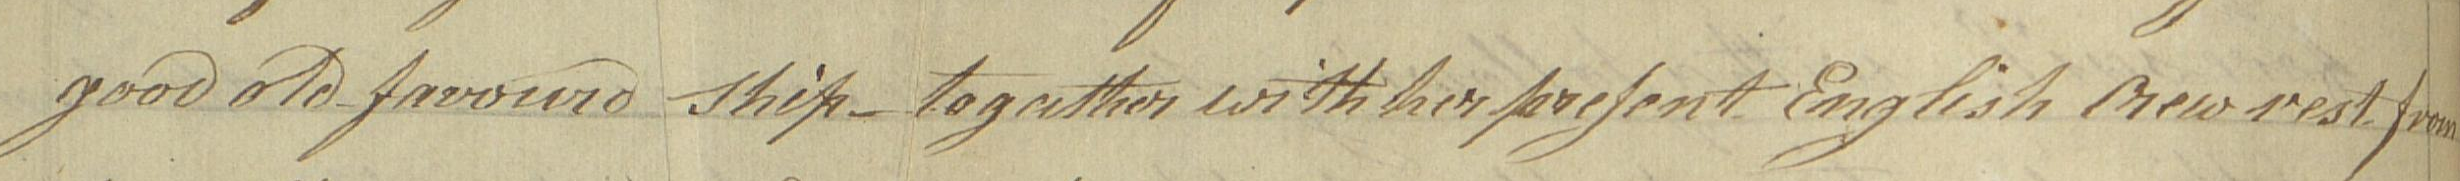good old favourd ship, together with her present English Crew rest from
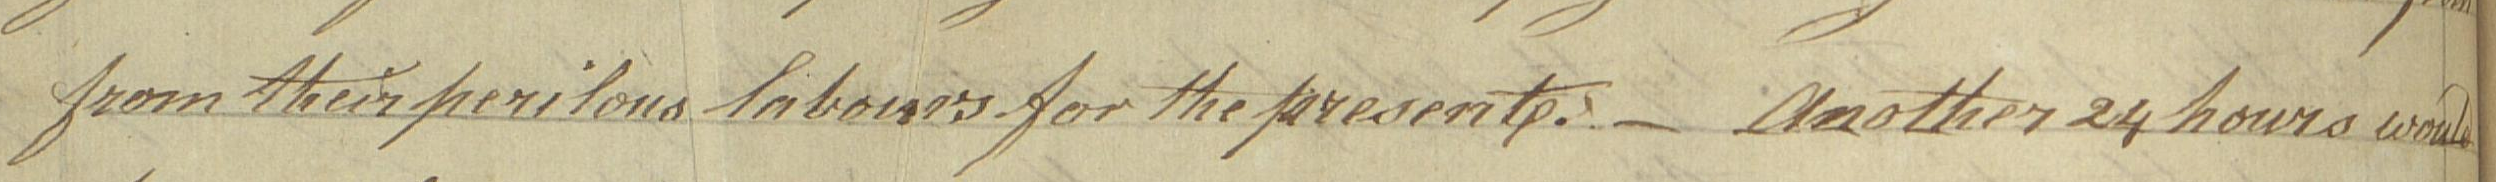from their perilous labours for the presents. Another 24 hours would
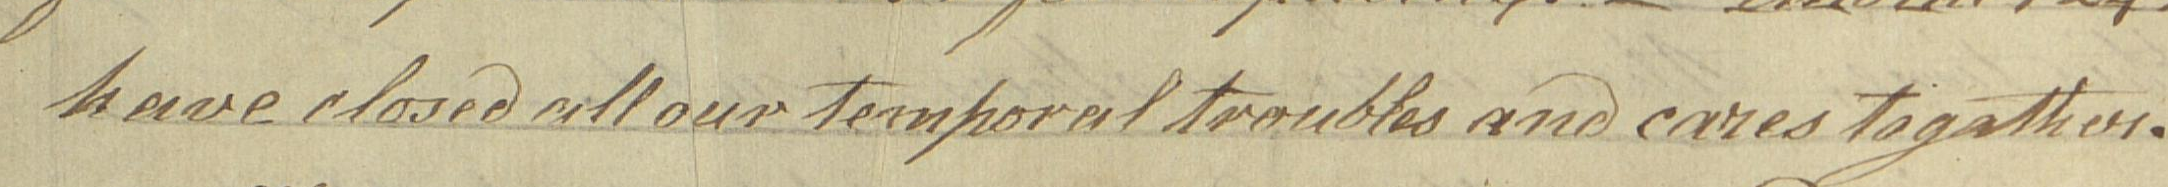have closed all our temporal troubles and cares together.
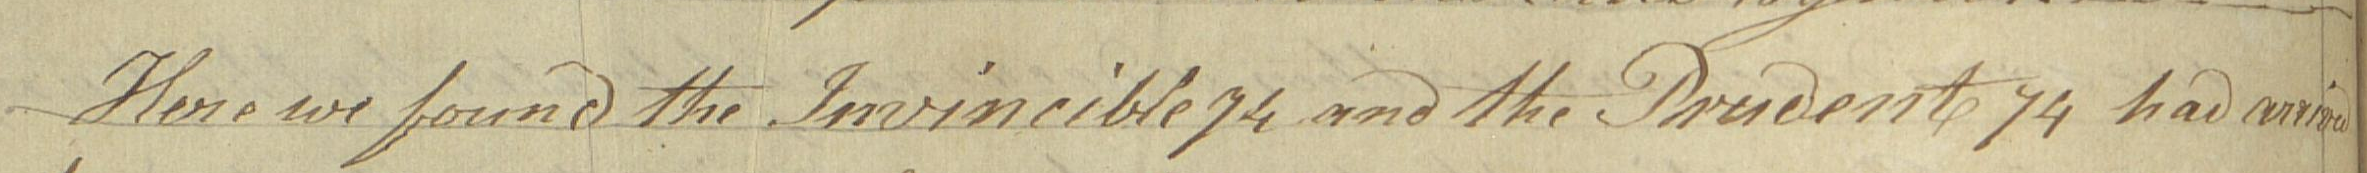Here we found the Invincible 74 and the Prudent 74 had around
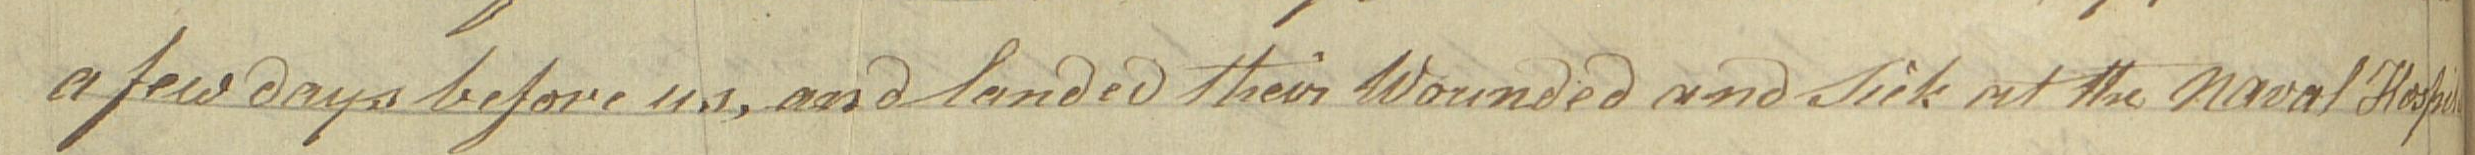a few days before us, and landed their Wounded and Sick at the Naval Hospital
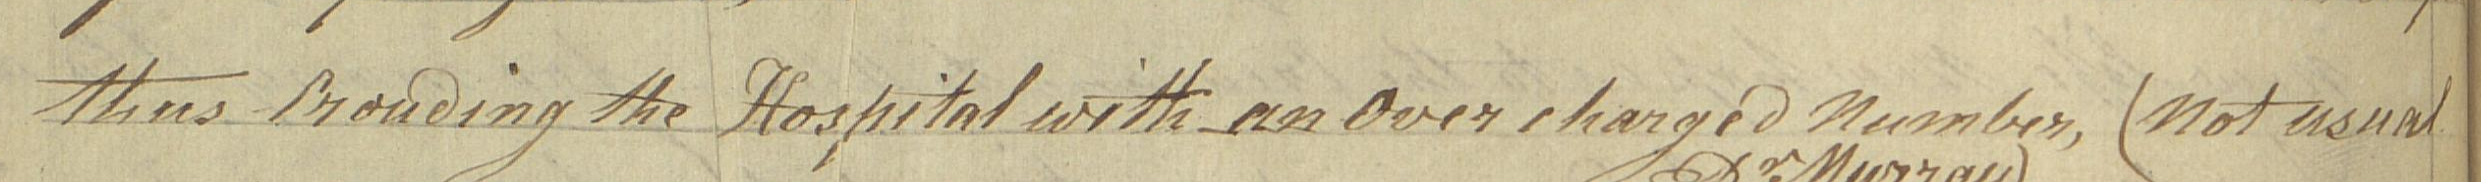thus Crouding the Hospital with an over charged Number, (Not usual
